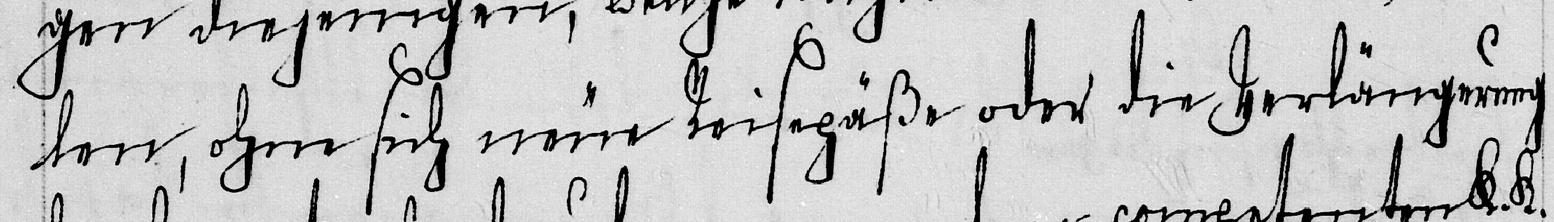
len, ohne sich neue Reisepäße oder die Verlängerung
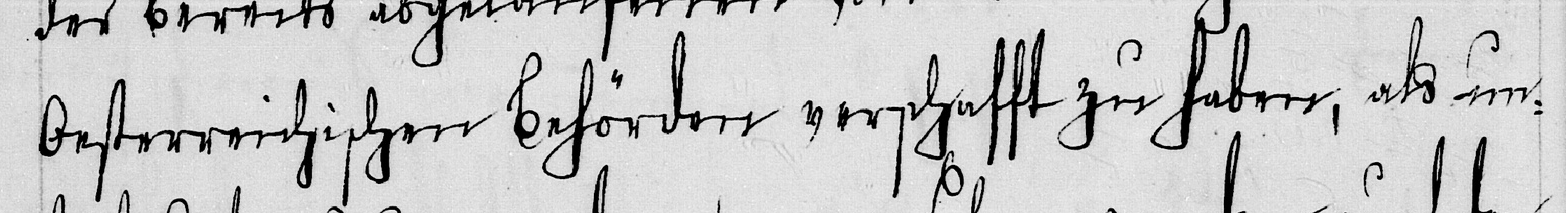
Oesterreichischen Behörde verschafft zu haben, als un¬
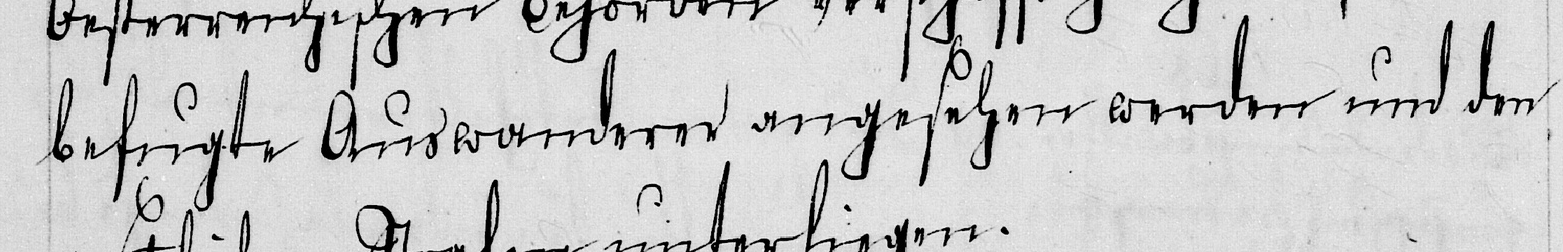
befugte Auswanderer angesehen werden und den
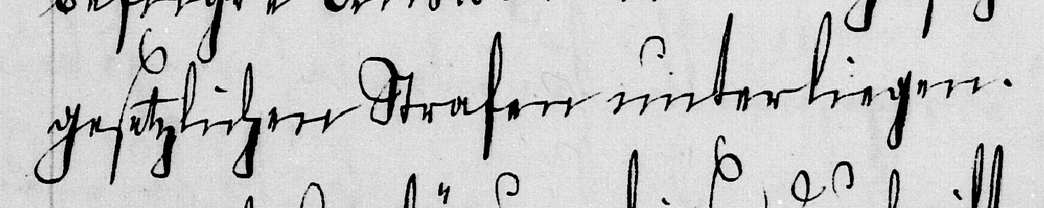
gesetzlichen Strafen unterliegen.
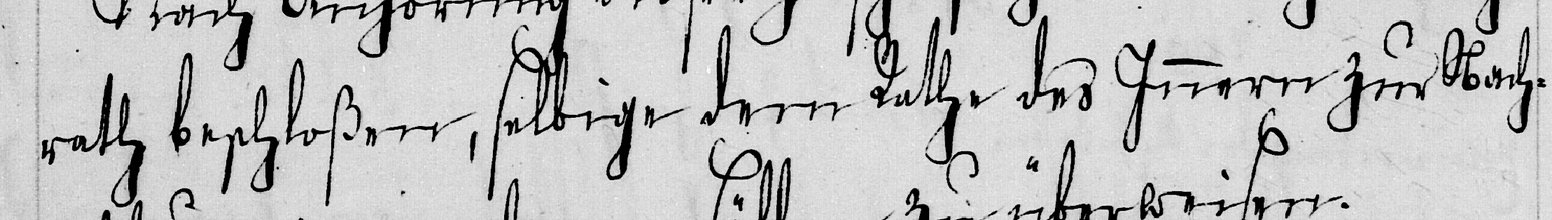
rath beschloßen, selbige dem Rathe des Innern zur Nach¬
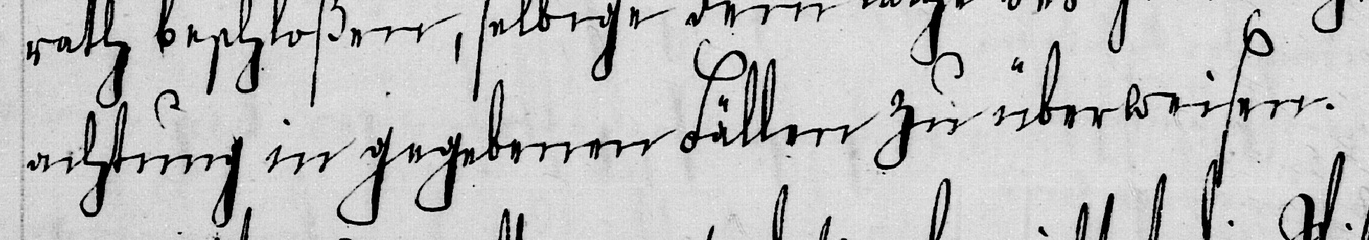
achtung in gegebenen Fällen zu überweisen.
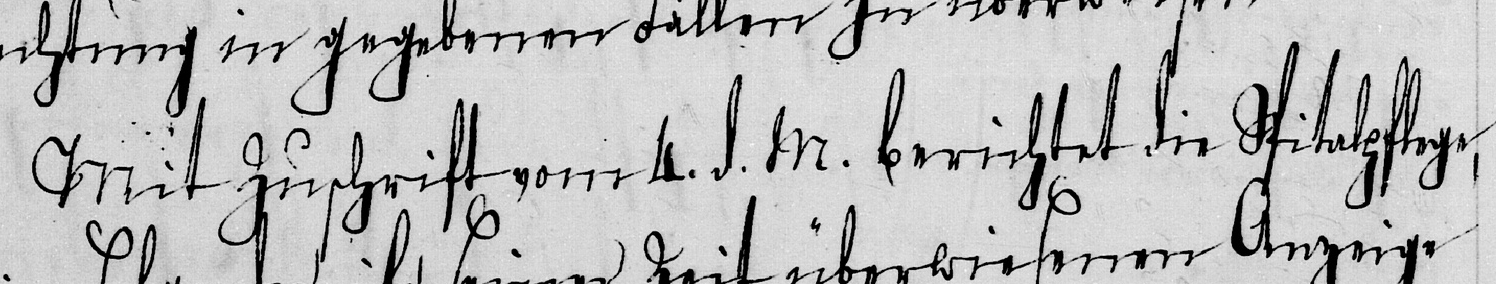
Mit Zuschrift vom 4. d. M. berichtet die Spitalpfl¬
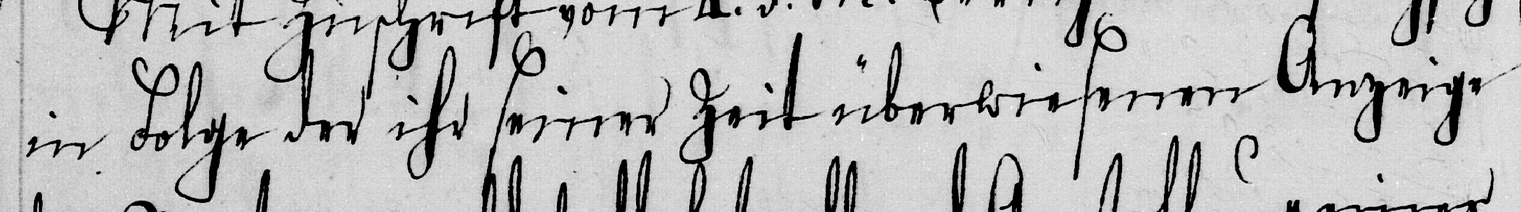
in Folge der ihr seiner Zeit überwiesenen Anzeige
